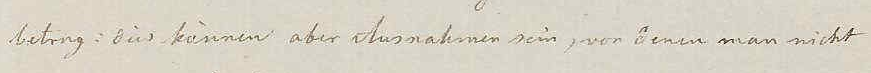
betrug: dies können aber Ausnahmen sein, von denen man nicht
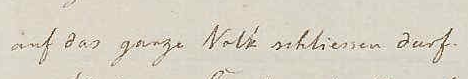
auf das ganze Volk schliessen darf.
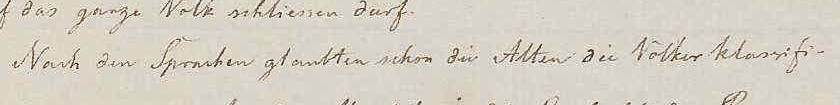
Nach den Sprachen glaubten schon die Alten die Völker klassifi-
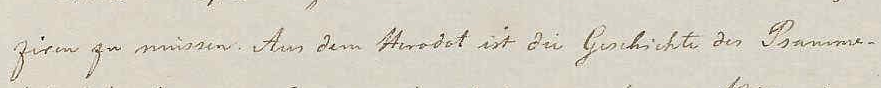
ziren zu müssen. Aus dem Herodot ist die Geschichte des Psamme-
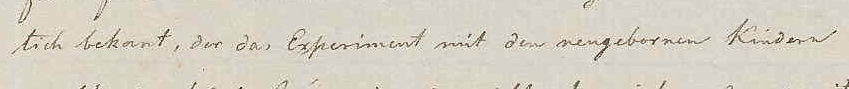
tich bekant, der das Experiment mit den neugebornen Kindern
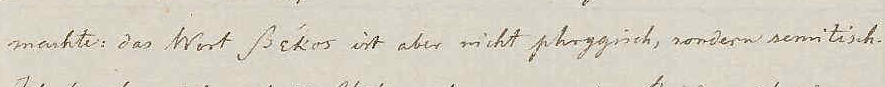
machte: dar Wort βέκος ist aber nicht phrygisch, sondern semitisch.
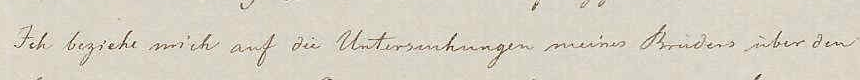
Ich beziehe mich auf die Untersuchungen meines Bruders über den
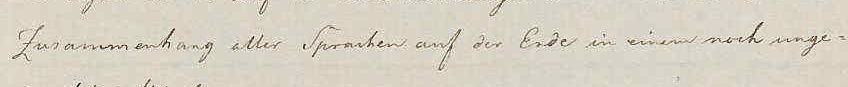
Zusammenhang aller Sprachen auf der Erde in einem noch unge-
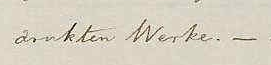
drukten Werke. – – – –
